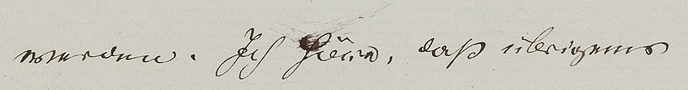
werden. Ich glaube, daß übrigens
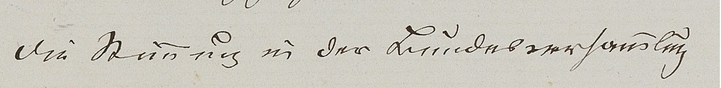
die Stimmung in der Bundesversammlung
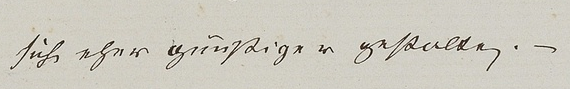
sich eher günstiger gestalte. –
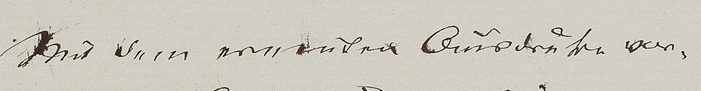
Mit dem erneuten Ausdruke vor-
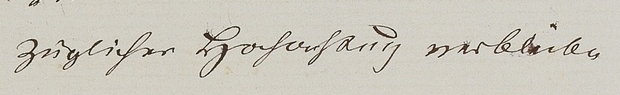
züglicher Hochachtung verbleibe
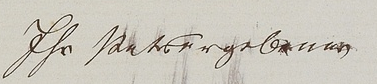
Ihr stets ergebener
